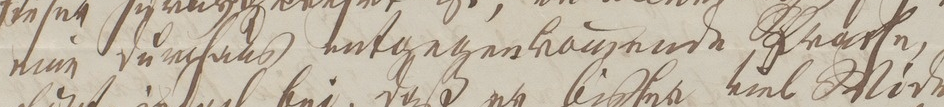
eine durchaus entgegenkommende Sprache,
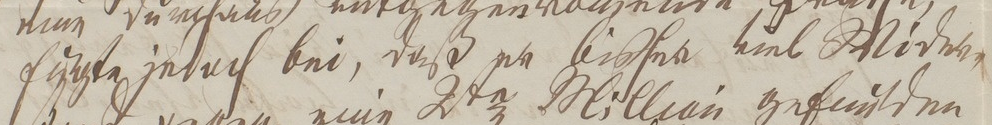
fügte jedoch bei, daß er bisher viel Wider-
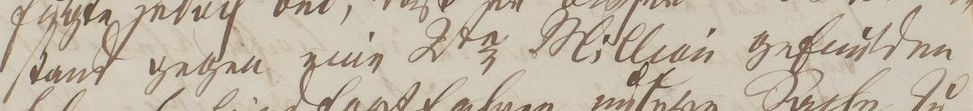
stand gegen eine 2te Million gefunden
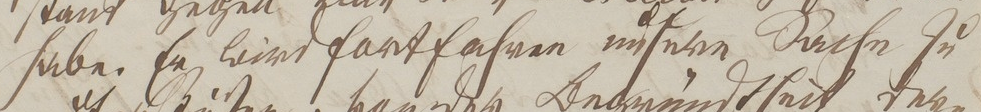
habe. Er wird fortfahren unsere Sache zu
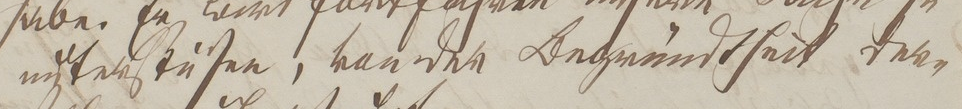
unterstüzen, von der Begründtheit der-
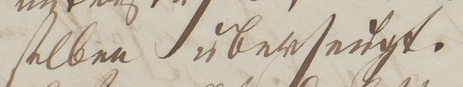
selben überzeugt.
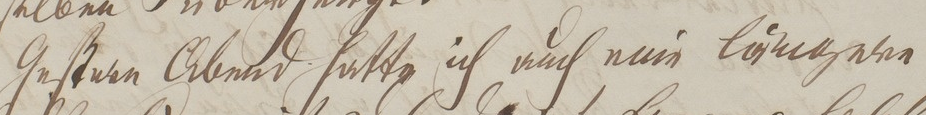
Gestern Abend hatte ich auch eine längere
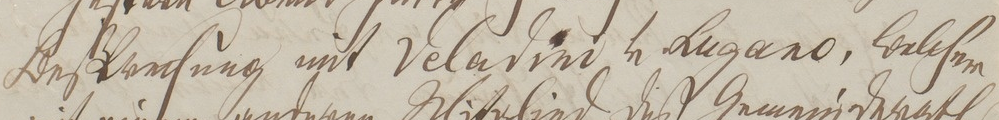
Besprechung mit Veladini v Lugano, welcher
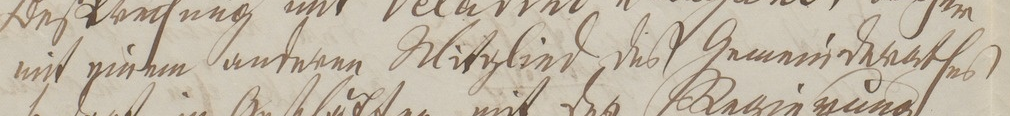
mit einem anderen Mitglied des Gemeinderathes
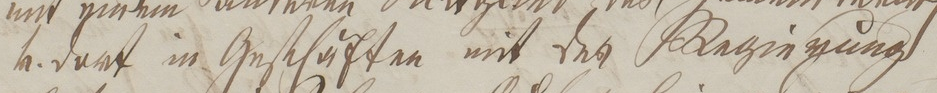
v. dort in Geschäften mit der Regierung
